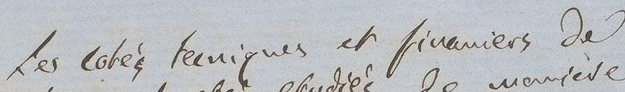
Les cotés tecniques et financiers de
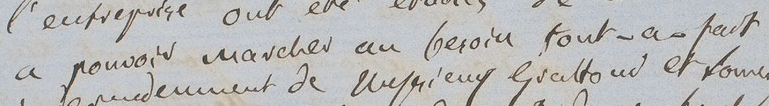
a pouvoir marcher au besoin tout-a-fait
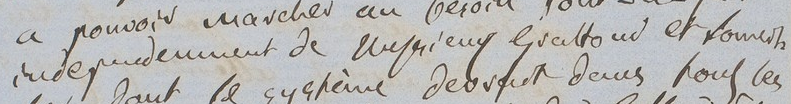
independemment de Messieurs Grattoni et Someil-
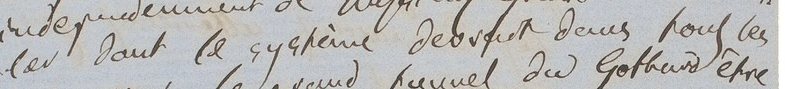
ler dont le système devrait dans tous les
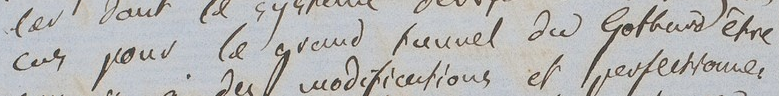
cas pour le grand tunnel du Gothard être
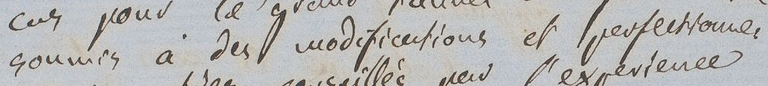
soumis à des modifications et perfectionne-
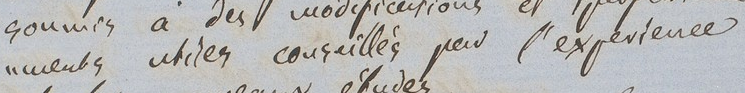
ments utiles conseillés par l'experience
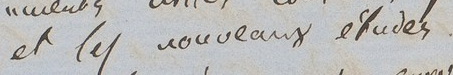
et les nouveaux études.
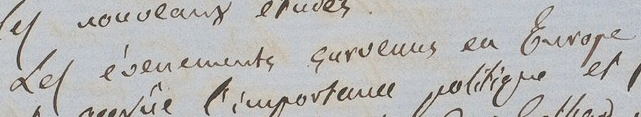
Les évenements survenus en Europe
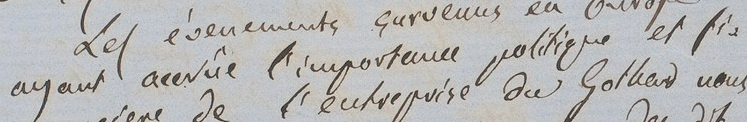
ayant accrûe l'importance politique et fi-
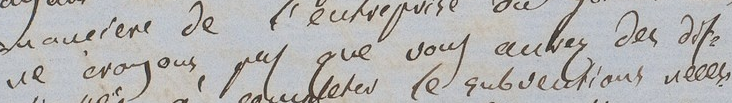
ne croyons pas que vous aurez des dif-
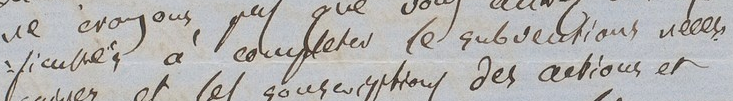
ficultés à completer le subventions neces-
